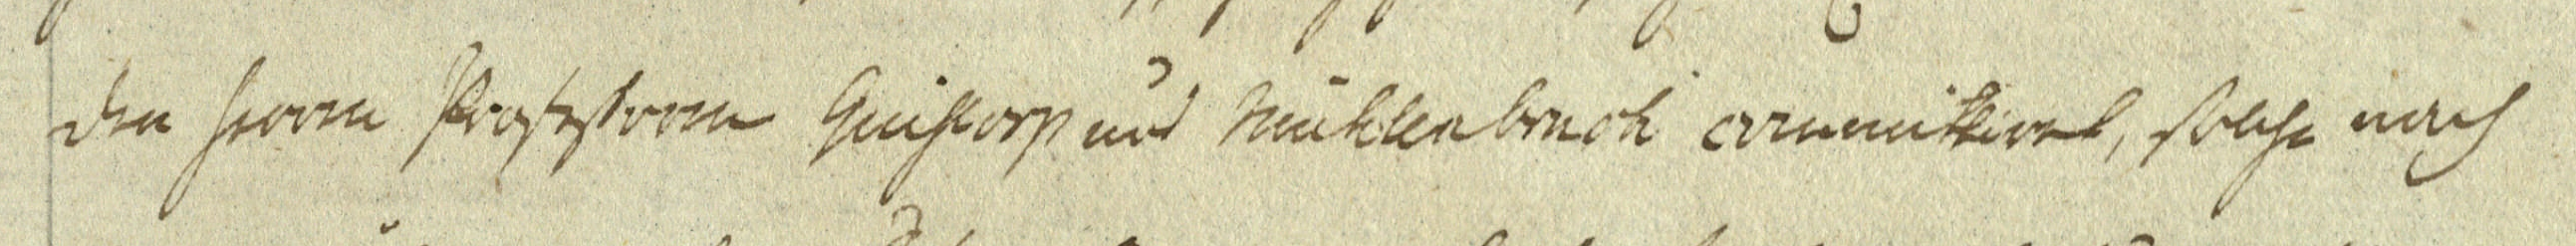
den Herren Professoren Quistorp und Mühlenbruch committiret, solche nach
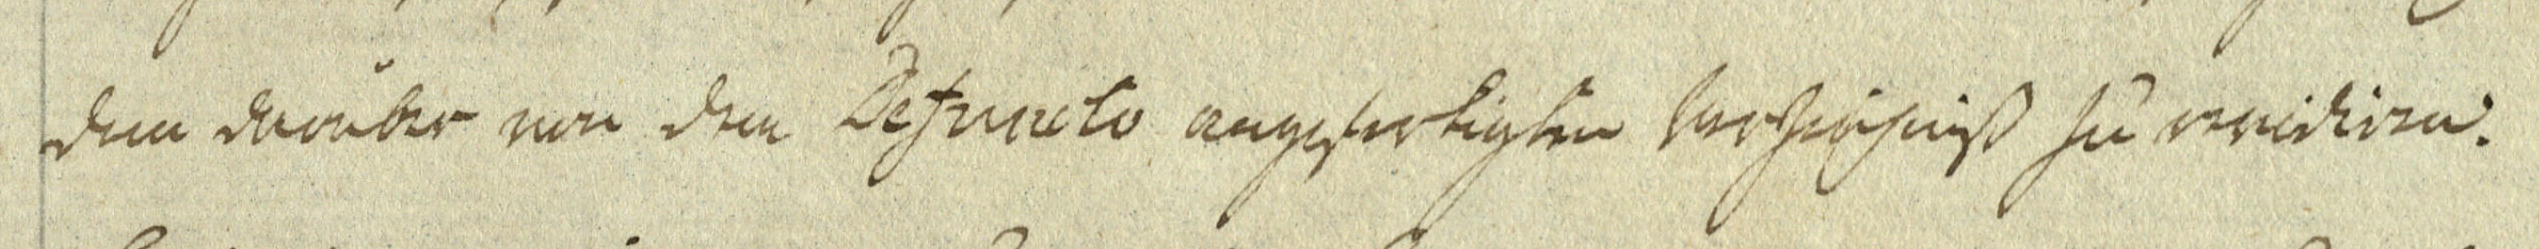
dem darüber von dem Defuncto angefertigten Verzeichniß zu revidiren.
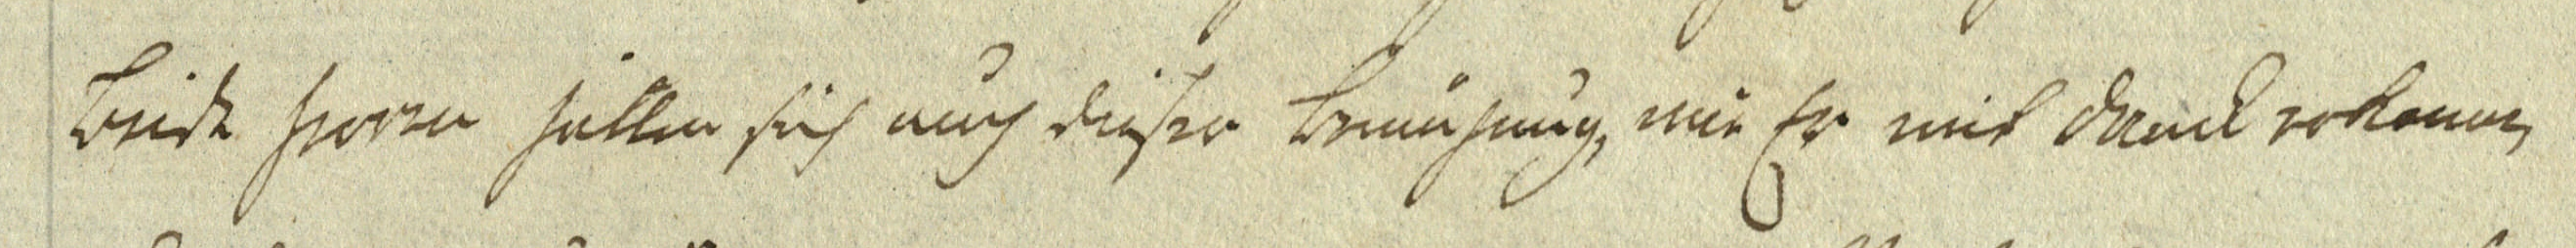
Beide Herren hätten sich auch dieser Bemühung, wie Er mit Danck erkenne,
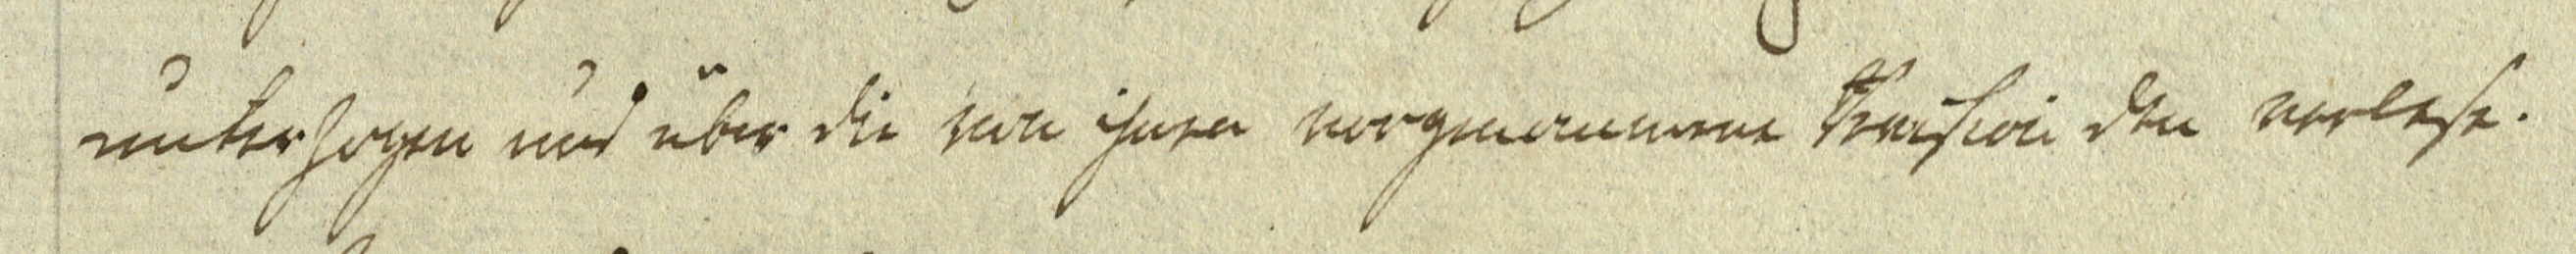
unterzogen und über die von ihnen vorgenommene Revision den verlese¬
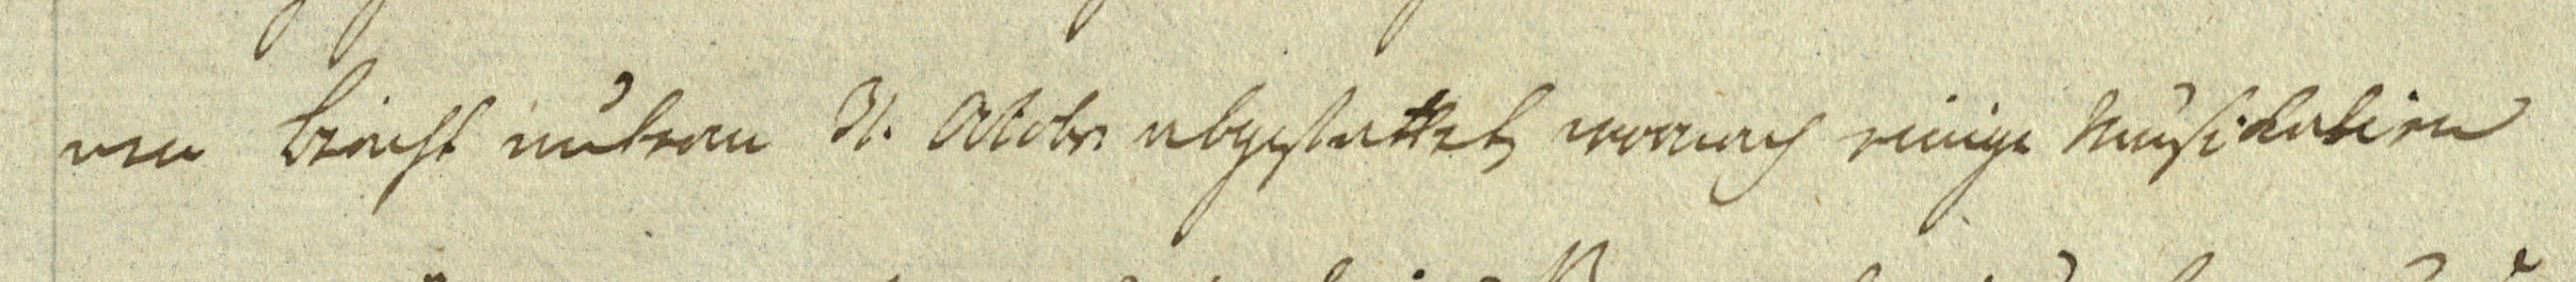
nen Bericht unterm 31. Octobr. abgestattet, wornach einige Musikalien
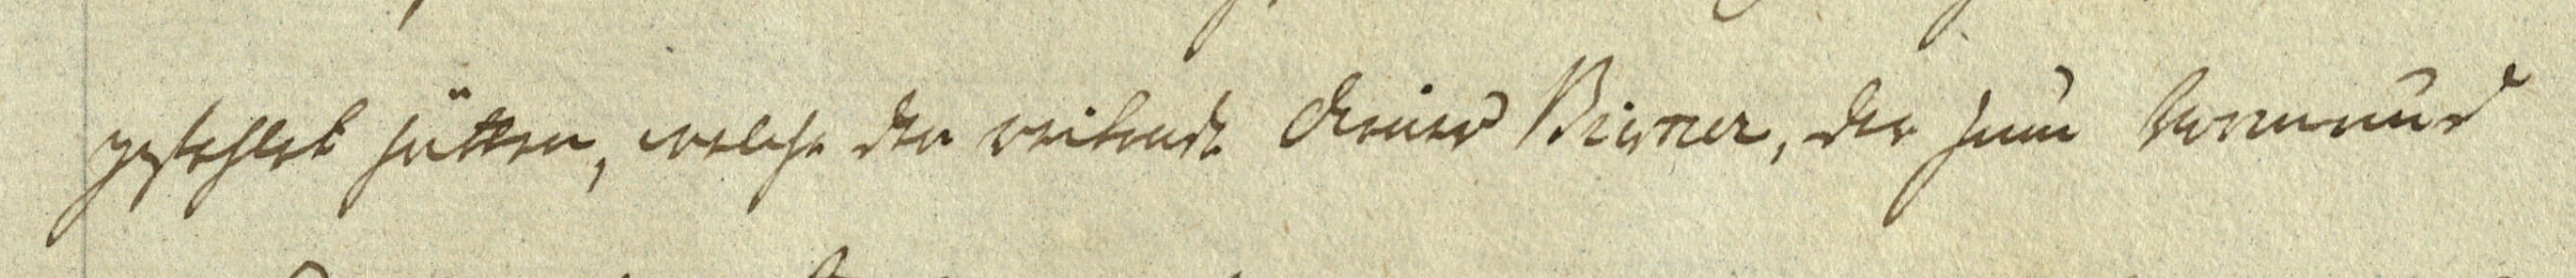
gefehlet hätten, welche der reitende Diener Biesner, der zum Vormund
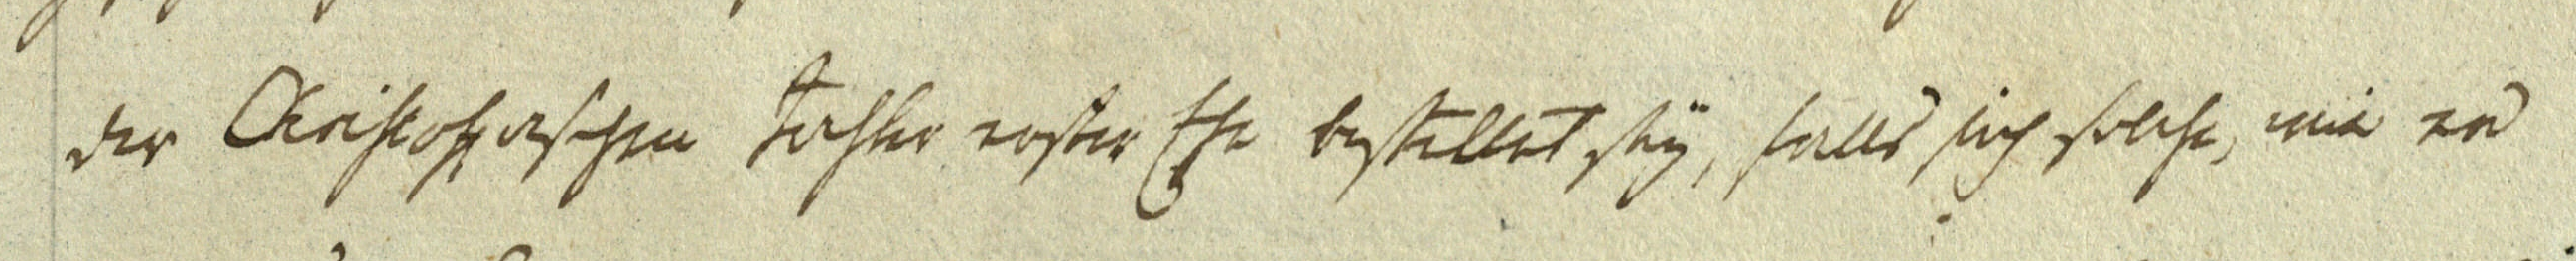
der Christopherschen Tochter erster Ehe bestellet seÿ, falls sich solche, in er
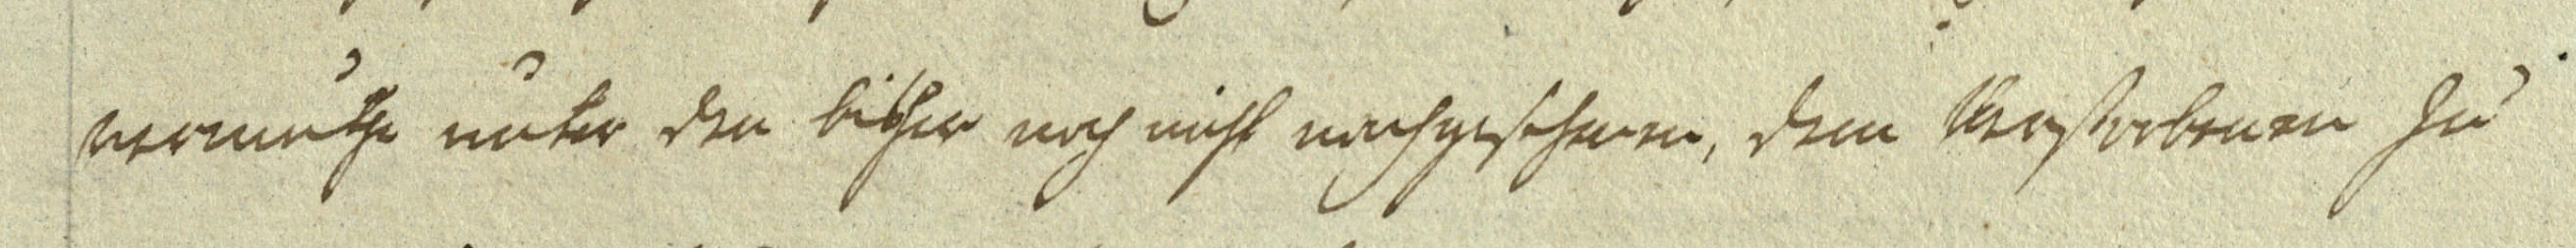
vermuthe unter den bisher noch nicht nachgesehenen, dem Verstorbenen zu
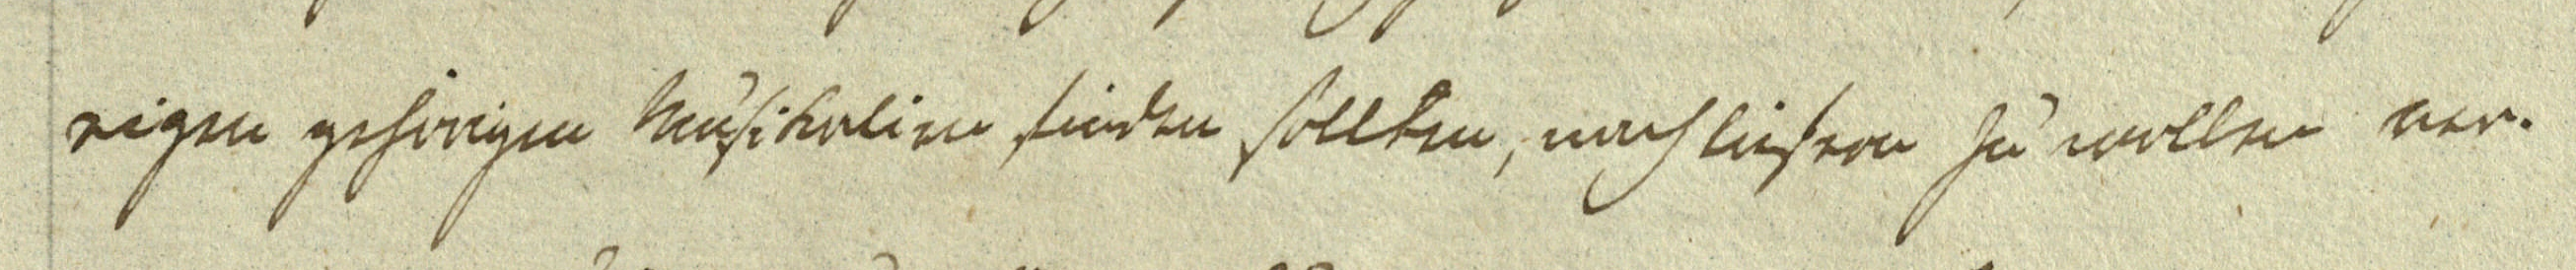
eigen gehörigen Musikalien finden sollten, nach liefern zu wollen ver¬
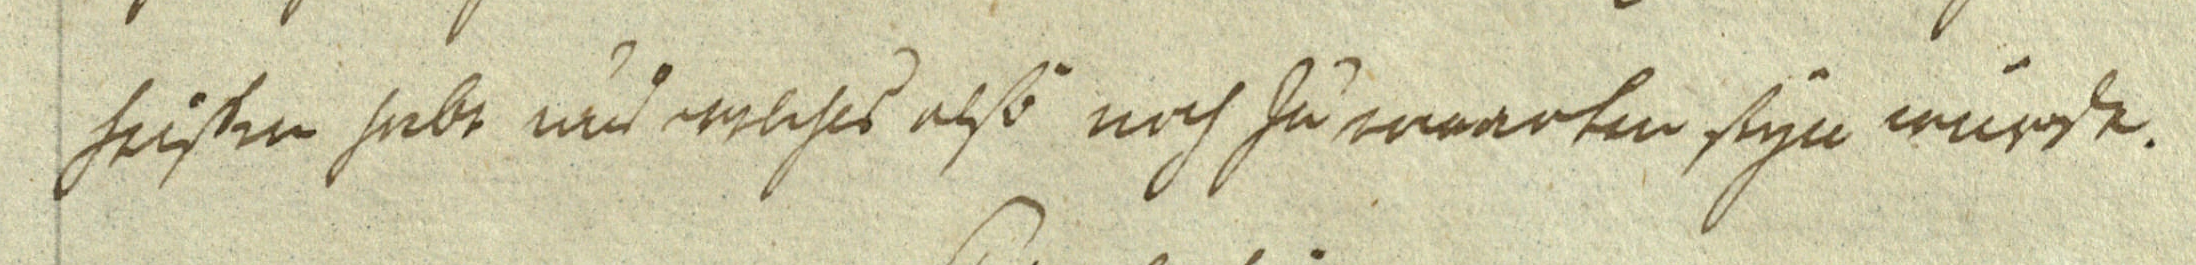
heissen habe und welches also noch zu erwarten seÿn würde.
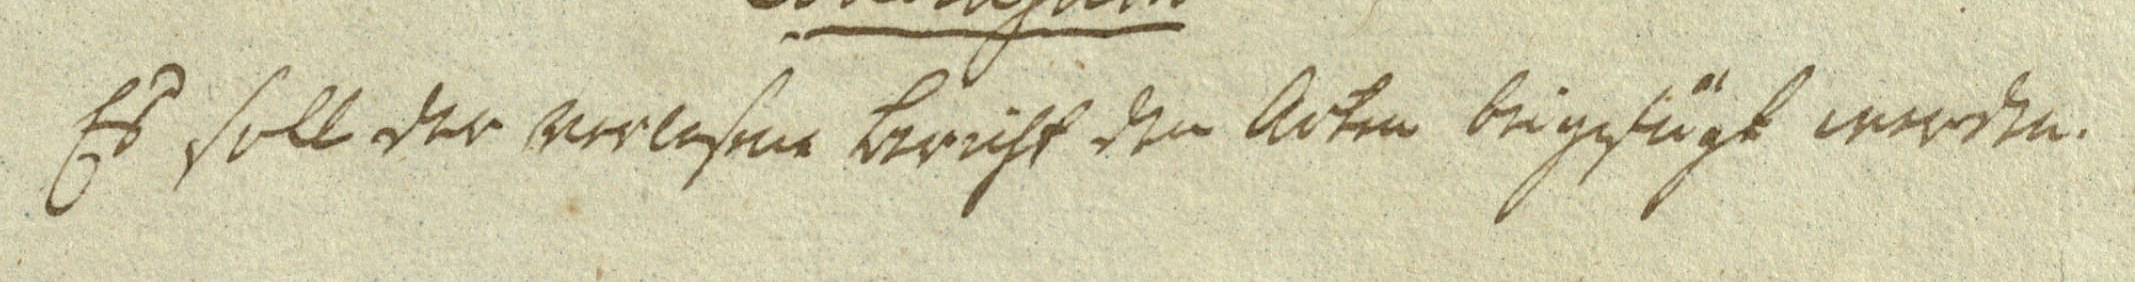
Es soll der verlesene Bericht den Acten beigefügt werden.
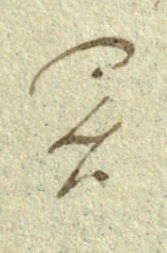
4.
